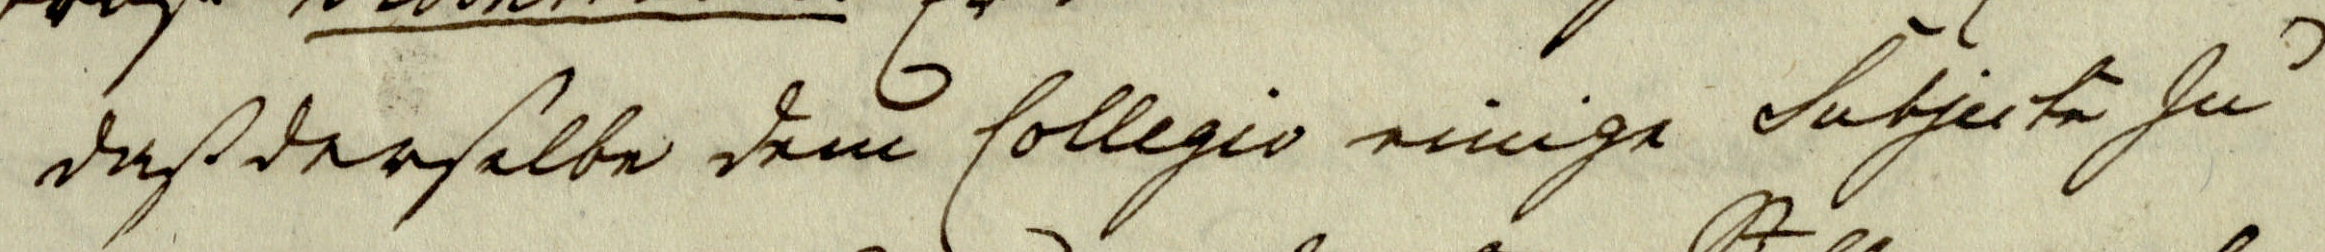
daß derselbe dem Collegio einige Subjecte zu
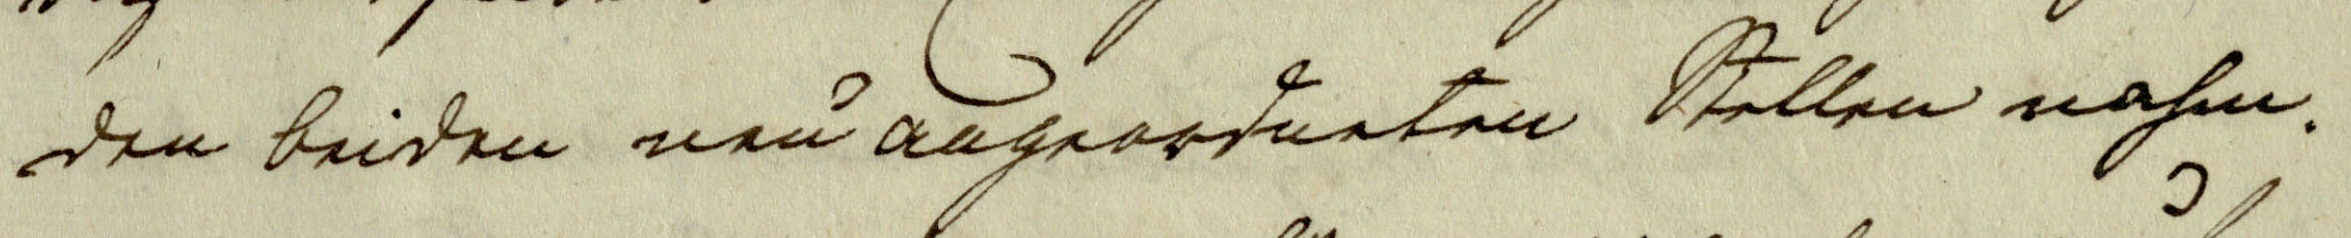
den beiden neu angeordneten Stellen nahm¬
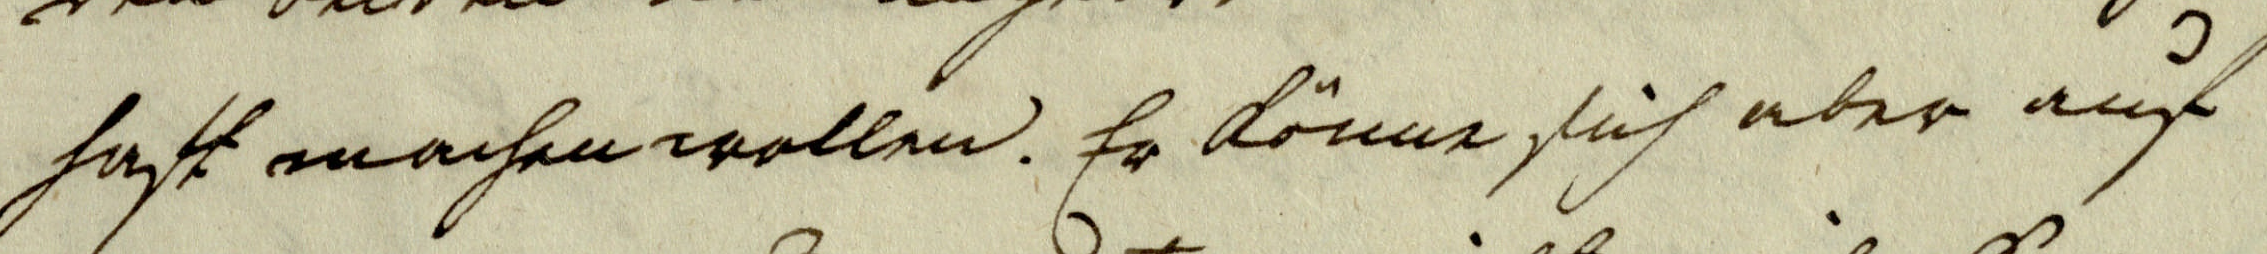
haft machen wollen. Er könne sich aber auf
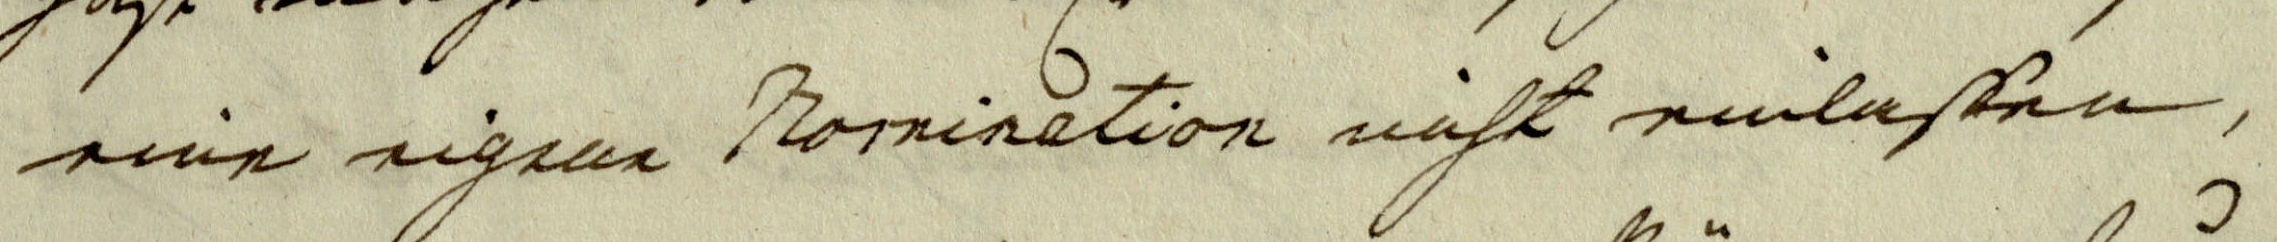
eine eigene Nomination nicht einlassen,
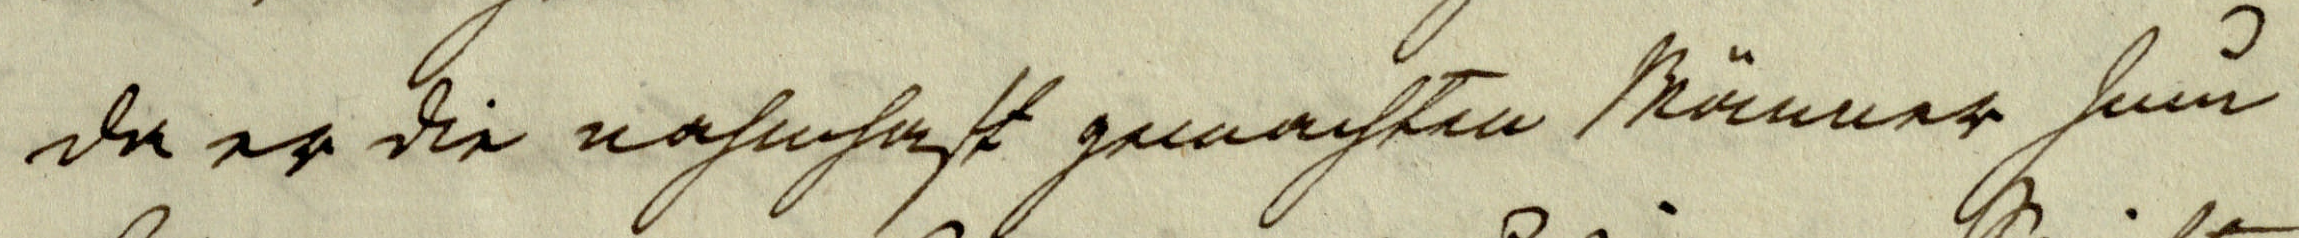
da er die nahmhaft gemachten Männer zum
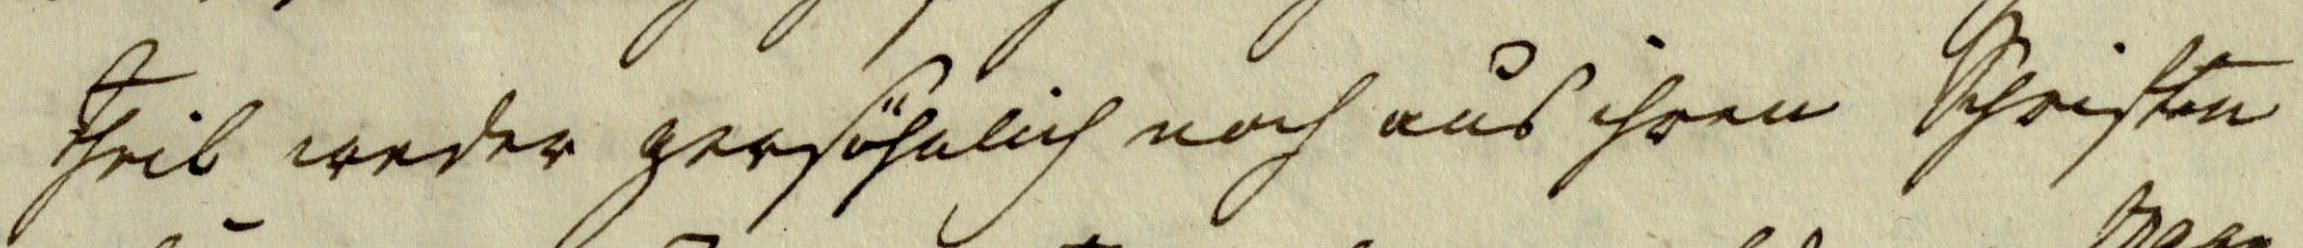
Theil weder persöhnlich noch aus ihren Schriften
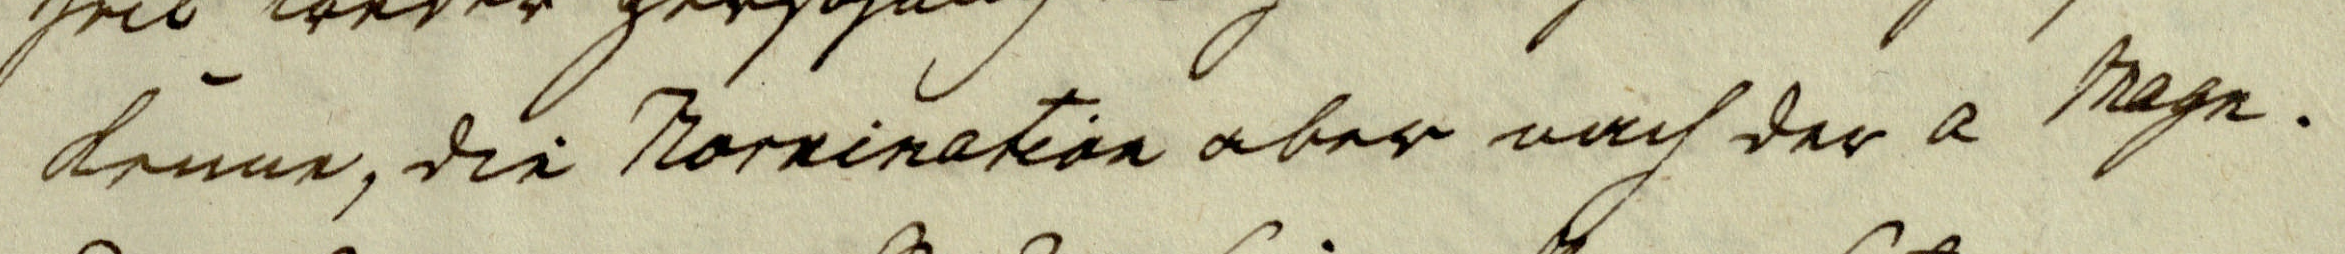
kenne, die Nomination aber nach der a Magn.
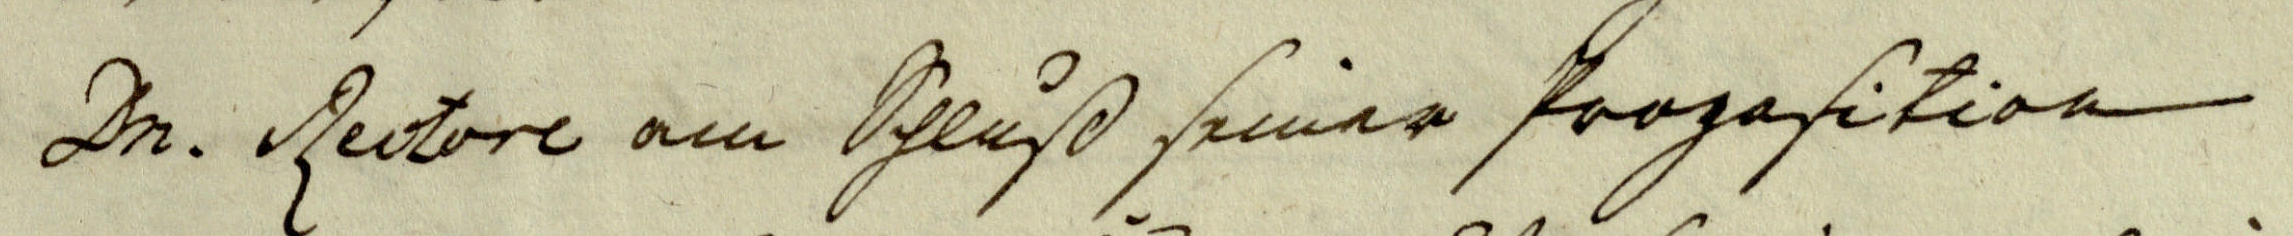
Dn. Rectore am Schluß seiner Proposition
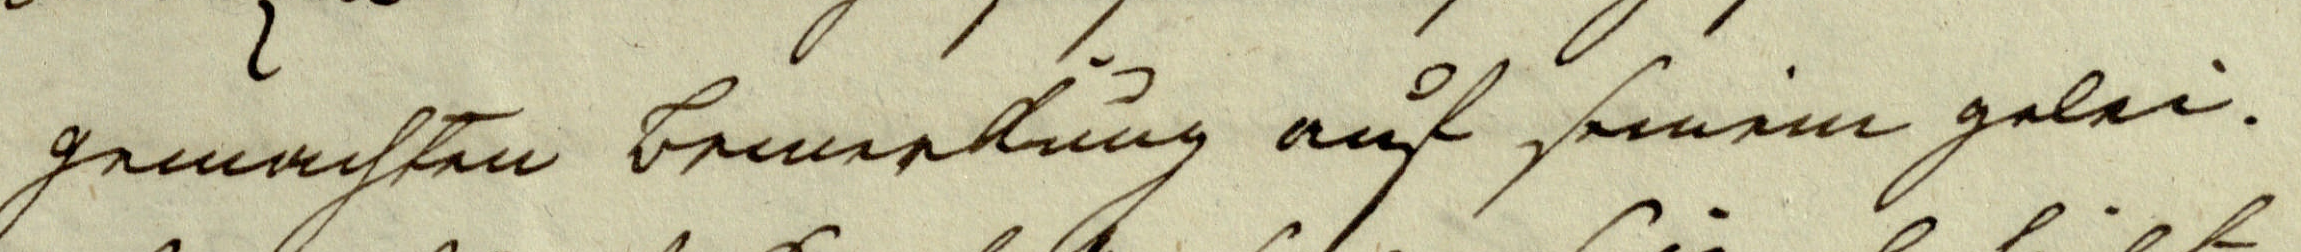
gemachten Bemerkung auf seinem gelei¬
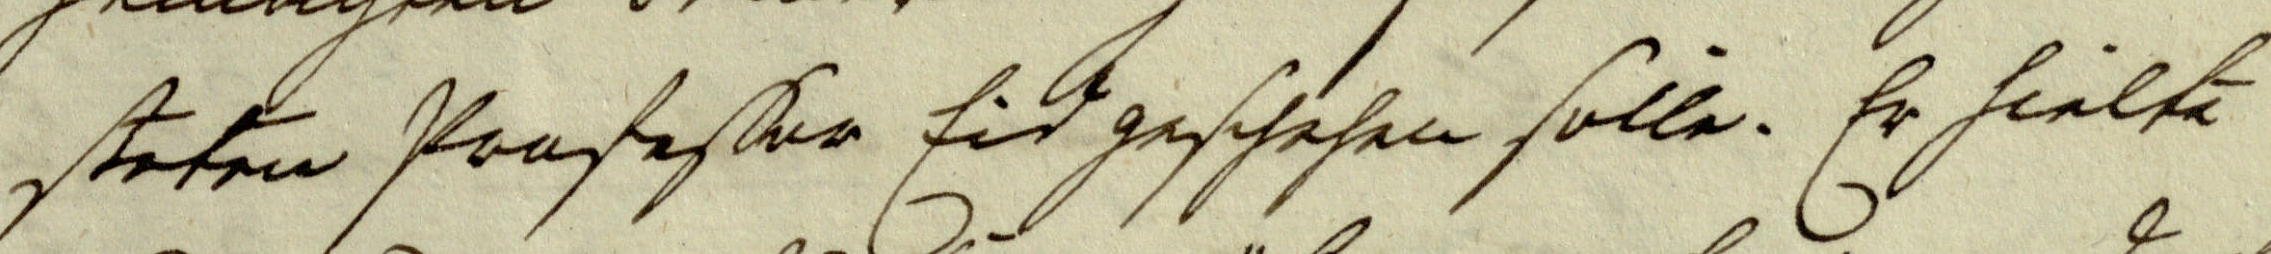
steten Professor Eid geschehen solle. Er hielte
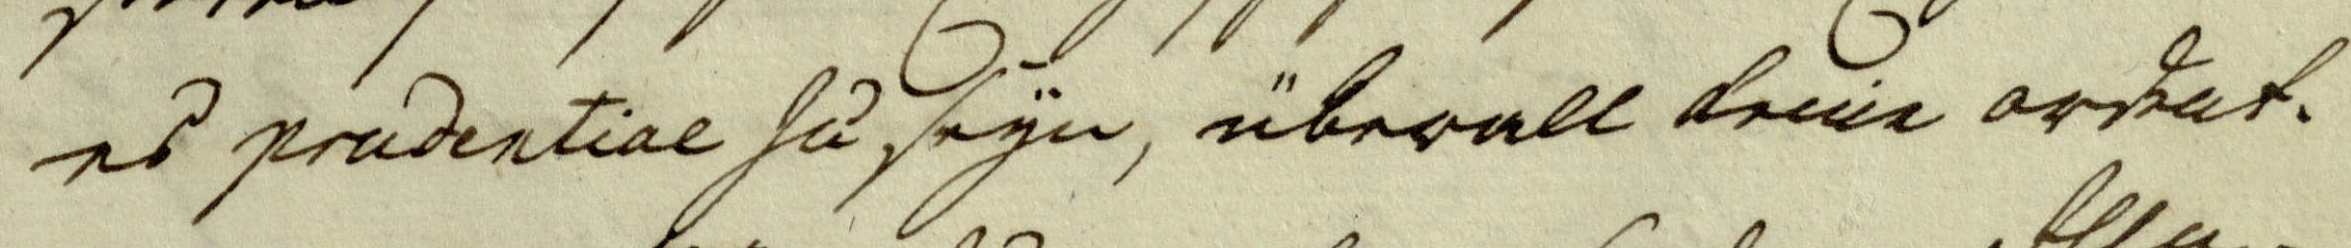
es prudentiae zu seÿn, überall keine ordent¬
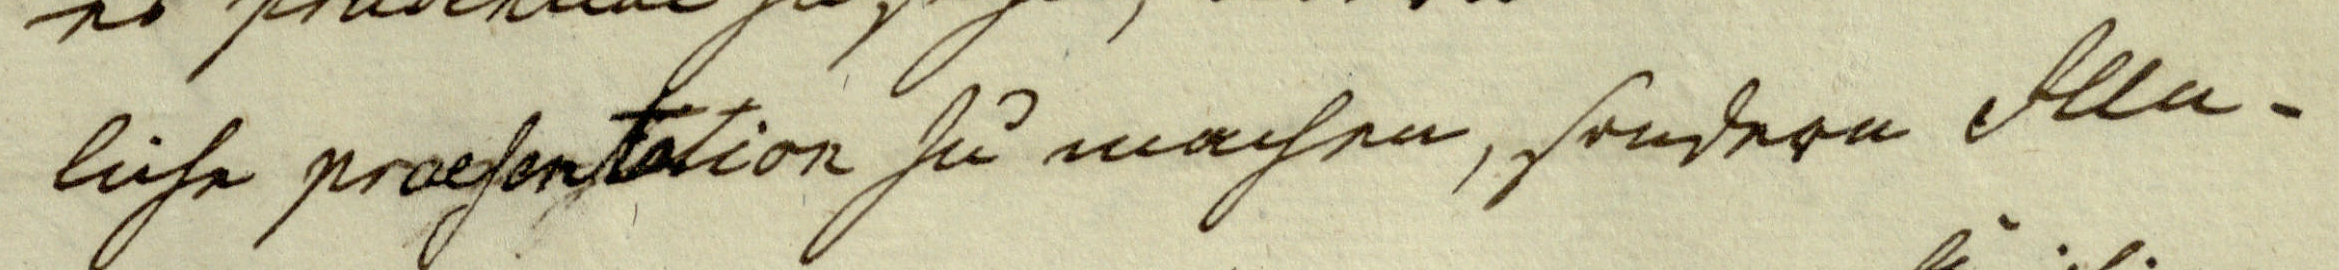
liche praesentation zu machen, sondern Illu¬
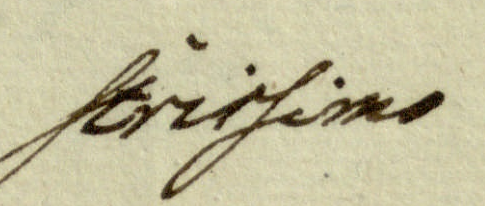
strissimo
